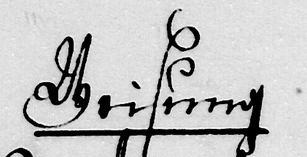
Weisung
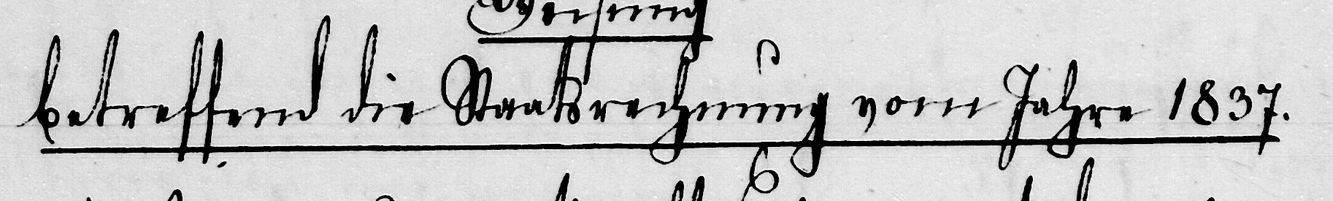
betreffend die Staatsrechnung vom Jahre 1837.
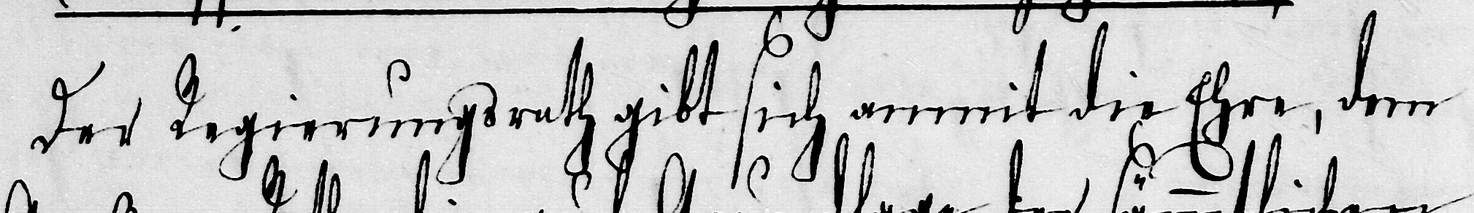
Der Regierungsrath gibt sich anmit die Ehre, dem
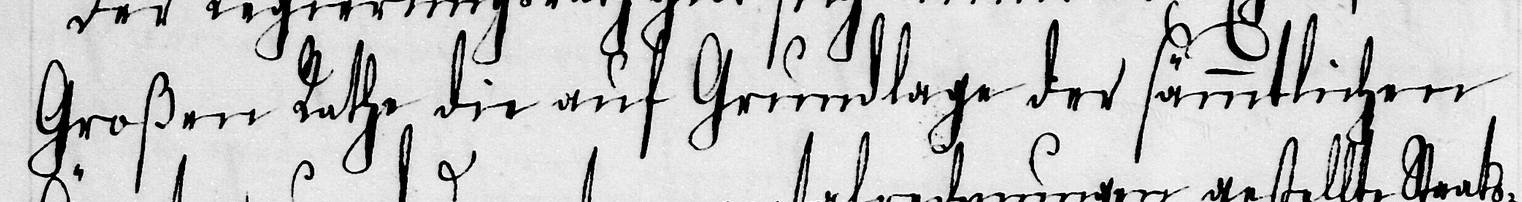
Großen Rathe die auf Grundlage der sämmtlichen
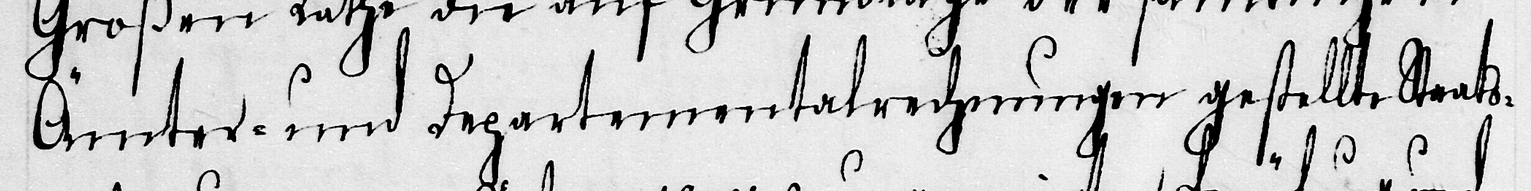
Ämter- und Departementalrechnungen gestellte Staat¬
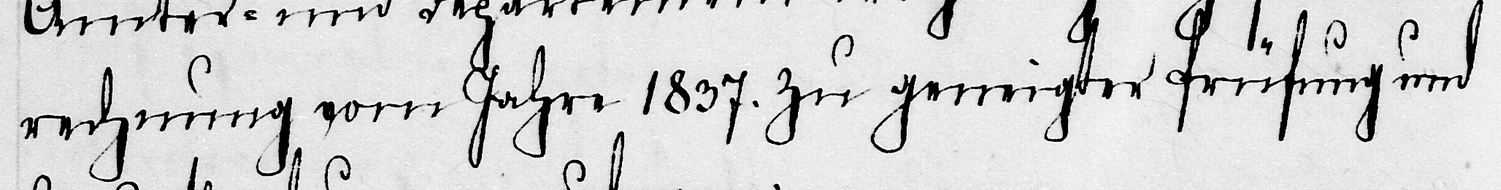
srechnung vom Jahre 1837. zu geneigter Prüfung und
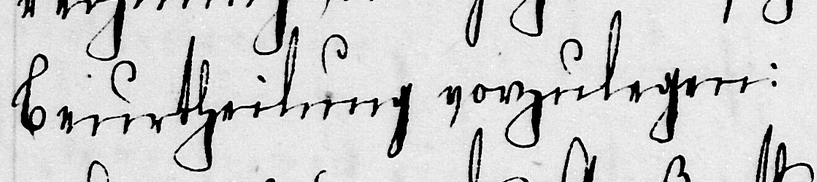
Beurtheilung vorzulegen:
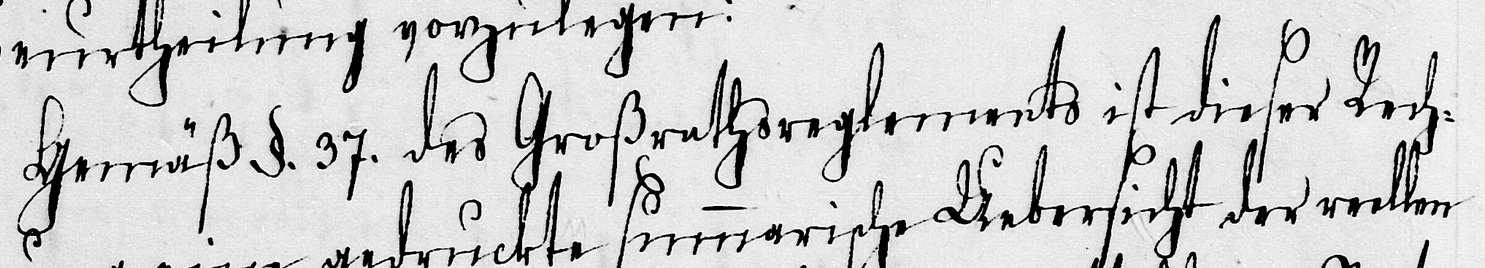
Gemäß §. 37. des Großrathsreglements ist dieser Rech¬
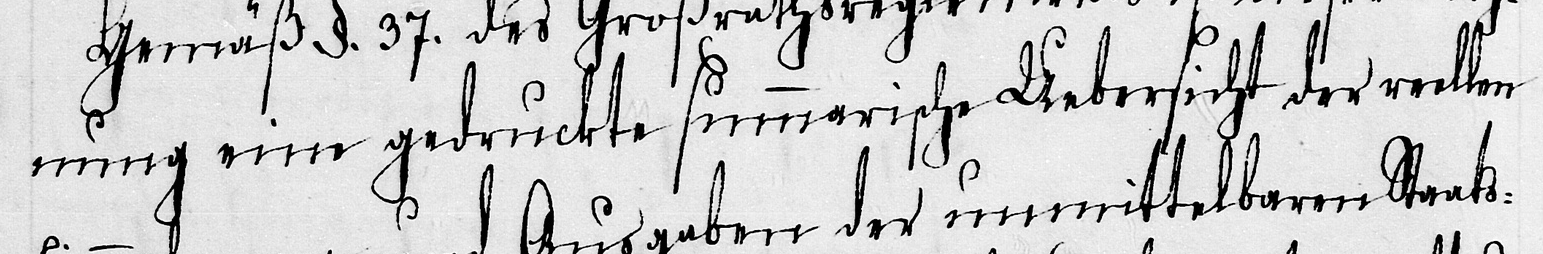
nung eine gedruckte summarische Uebersicht der ree¬
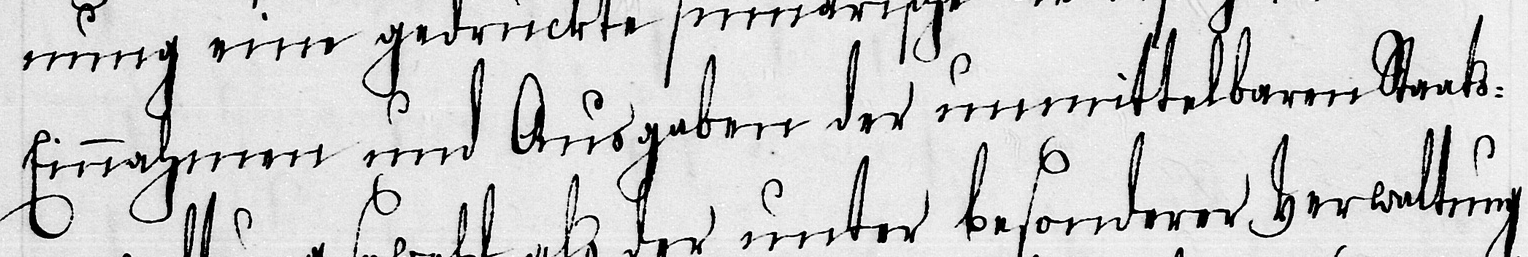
Einnahmen und Ausgaben der unmittelbaren Staats¬
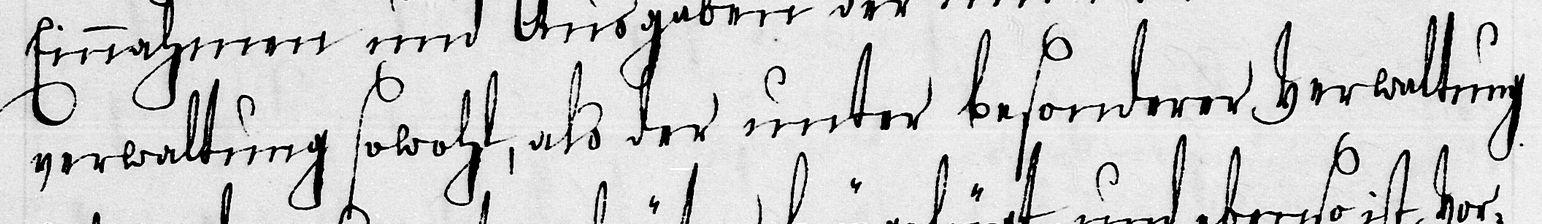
verwaltung sowohl, als der unter besonderer Verwaltung
